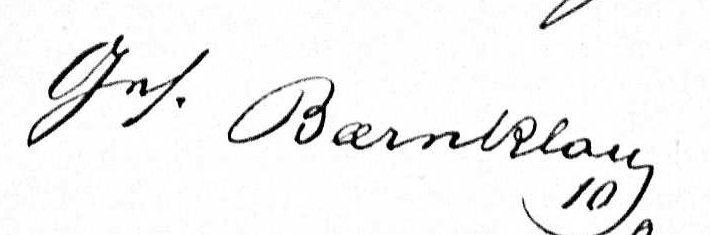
Ges. Baernklau
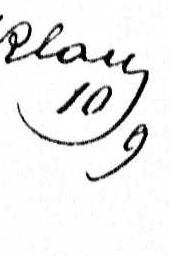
10/9
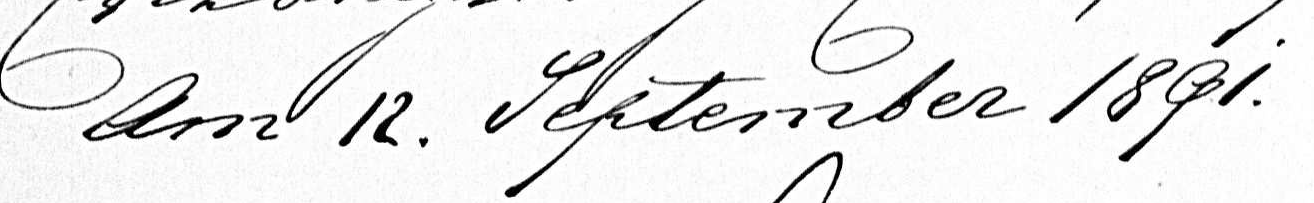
Am 12. September 1891
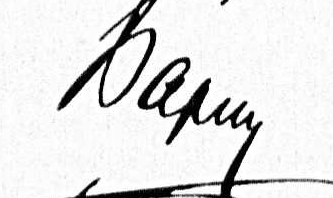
Papay
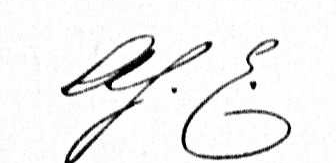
Ah. E.
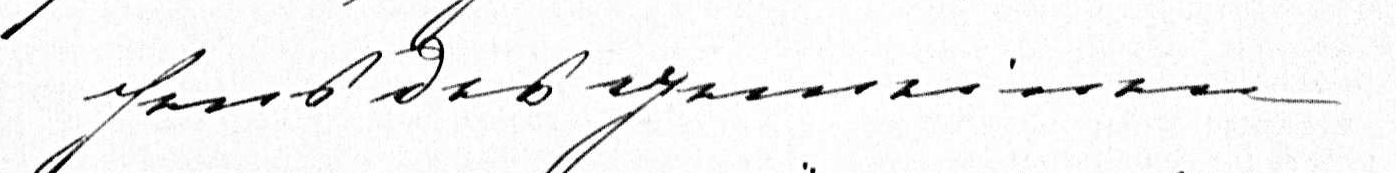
chens des gemeinen
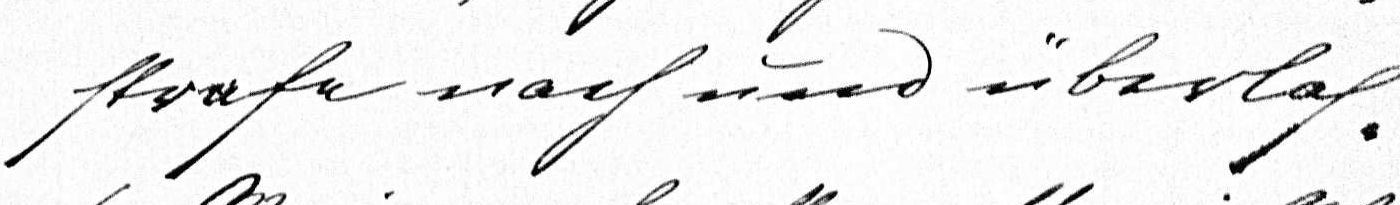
strafe nach und überlas¬
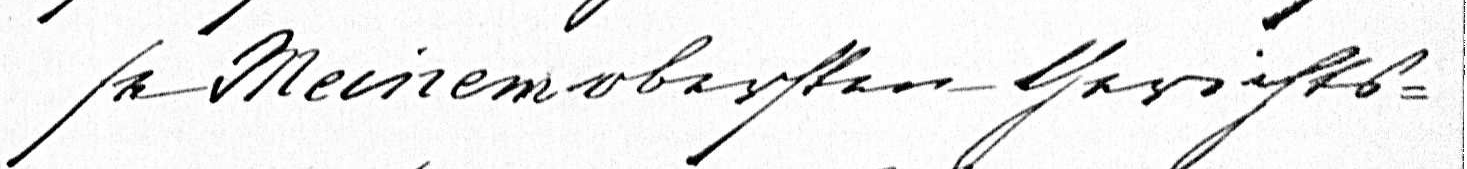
se Meinem obersten Gerichts-
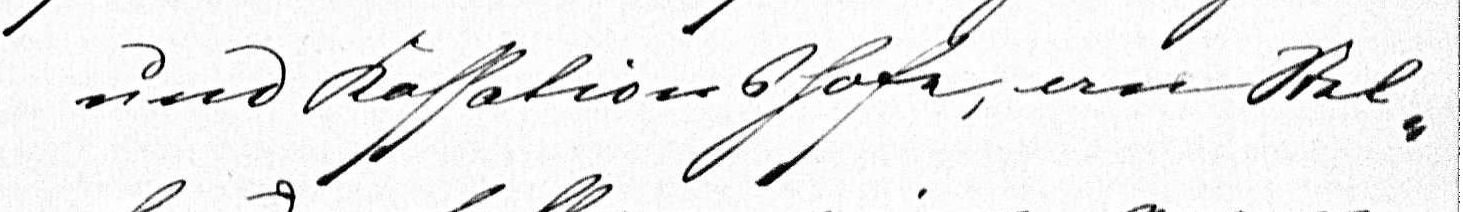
und Kassationshofe, an Stel¬
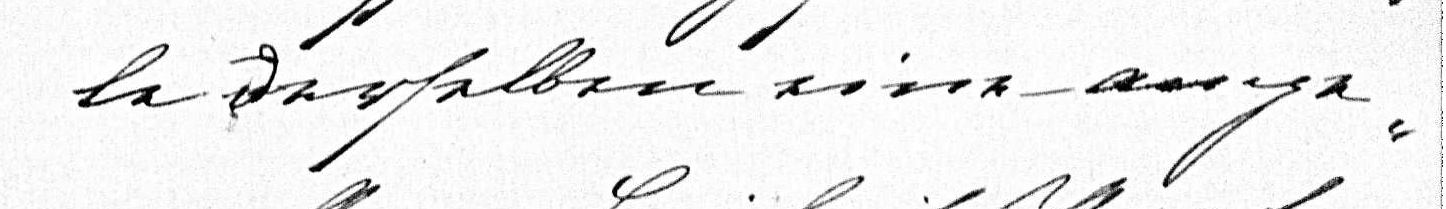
le derselben eine ange¬
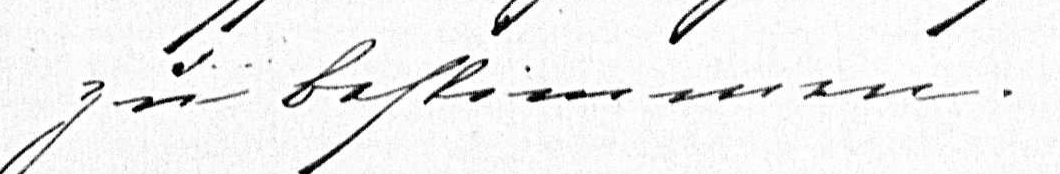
zu bestimmen.
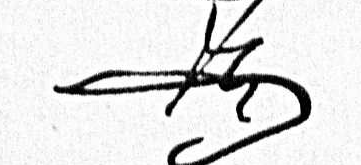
FJ
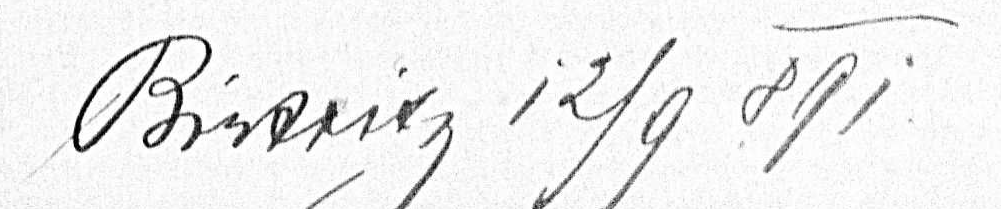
Birtnitz 12/9 1891
